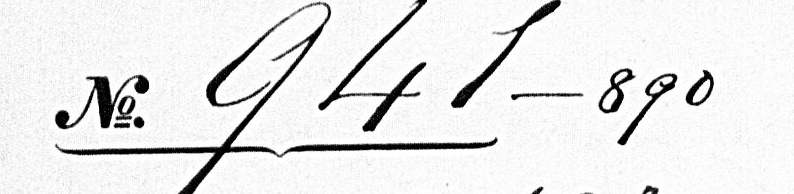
N° 941 – 890
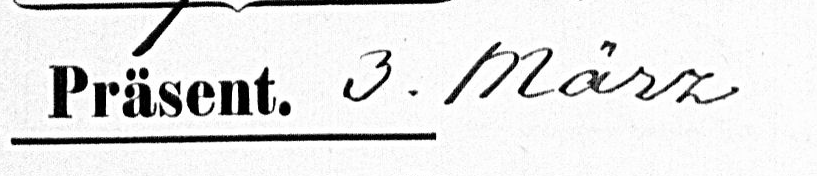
Präsent. 3. März
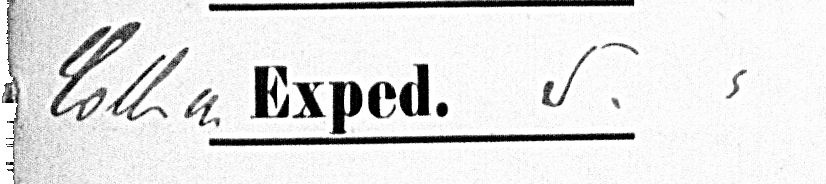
Coll a. Exped. 5. März
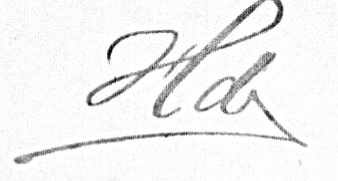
Hdr
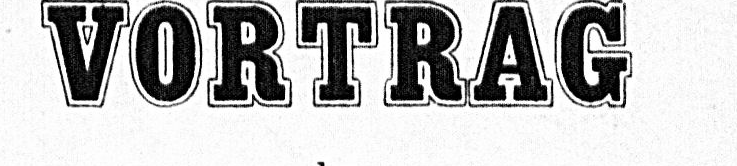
VORTRAG
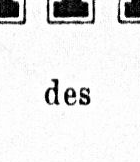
des
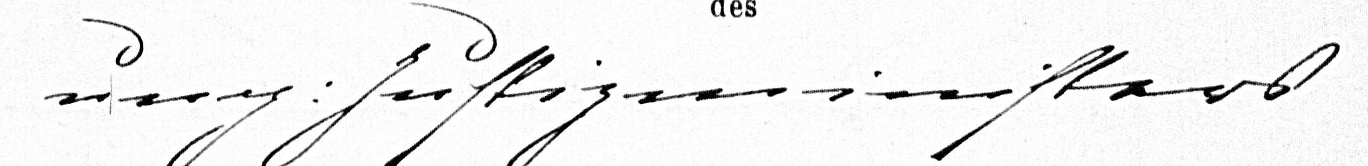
ung: Justizministers
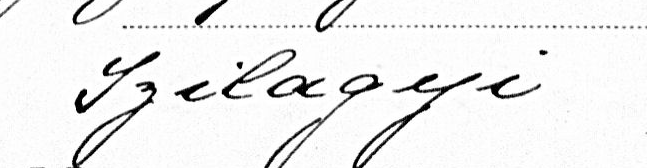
Szilagyi
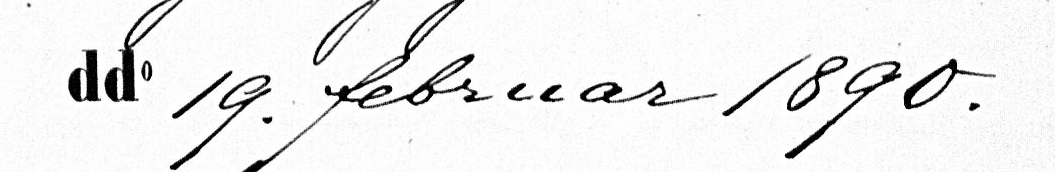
dd° 19. Februar 1890.
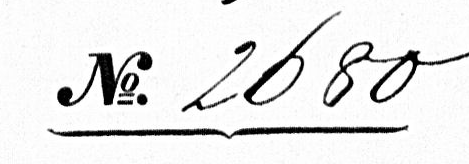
N° 2680
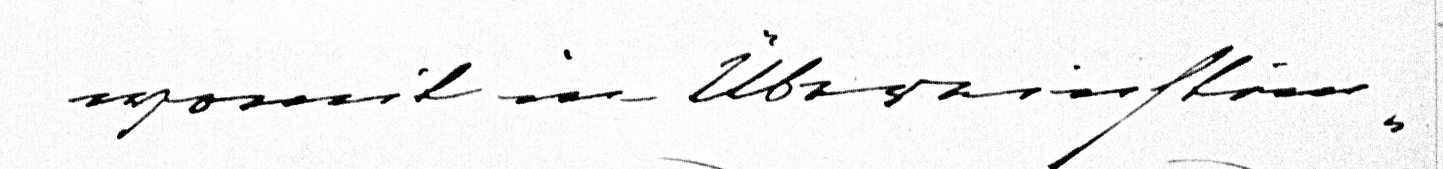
womit in Übereinstim¬
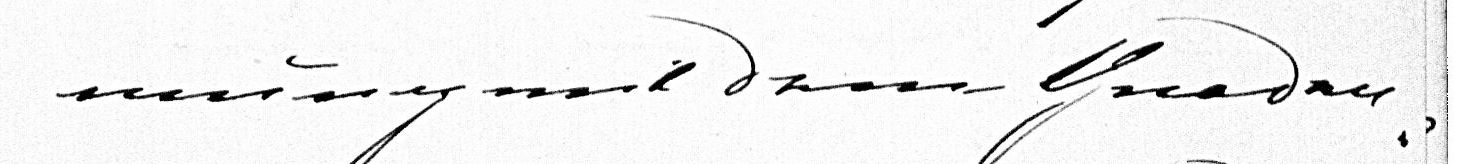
mung mit dem Gnaden¬
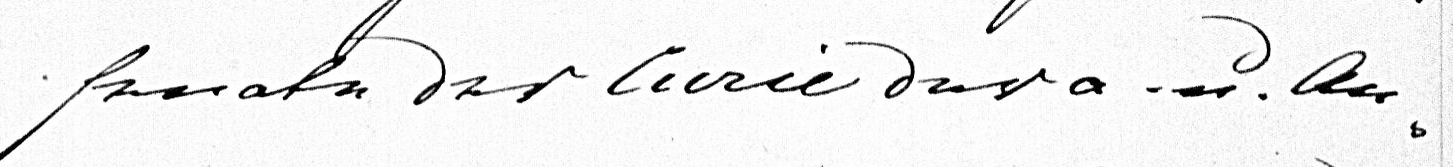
senate der Curic der a. u. An¬
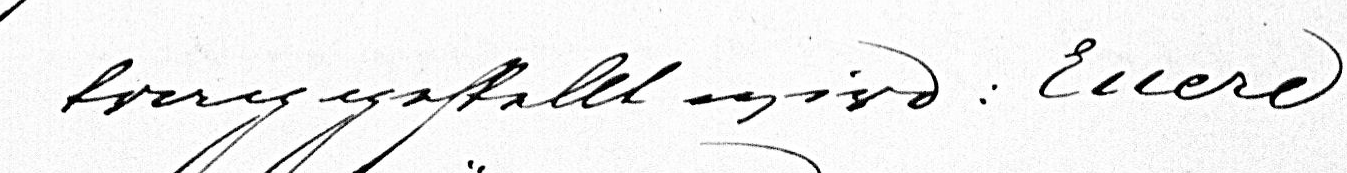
trag gestellt wird: Euere
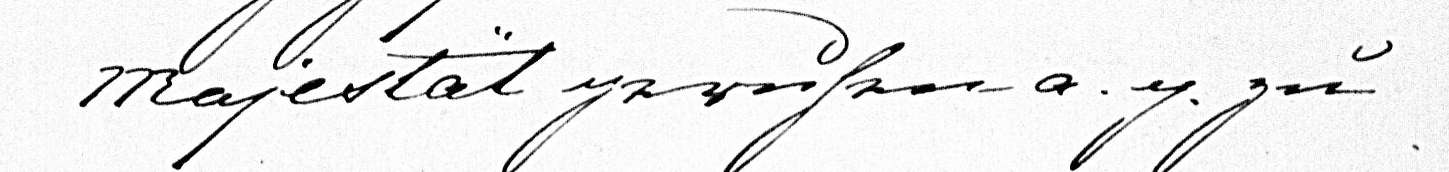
Majestät geruhen a. g. zu
